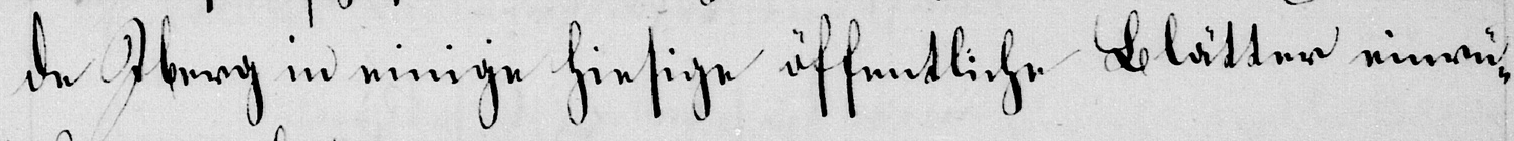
de Iberg in einige hiesige öffentliche Blätter einrü¬
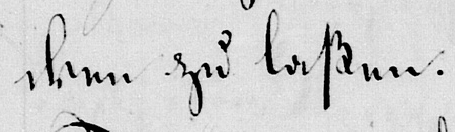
cken zu laßen.
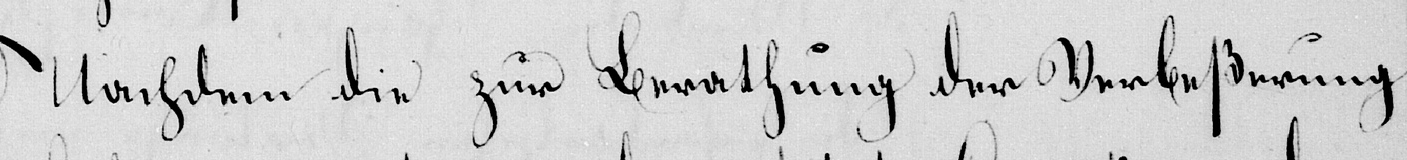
Nachdem die zur Berathung der Verbeßerung
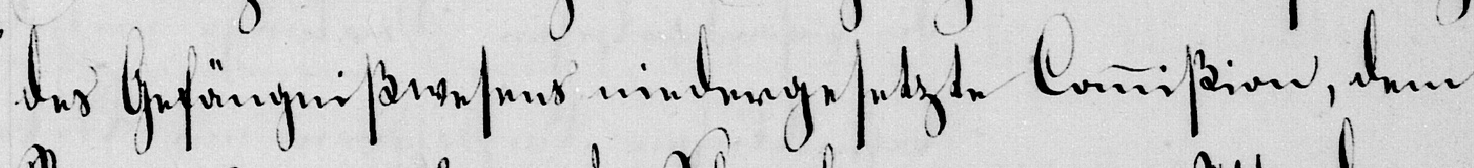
des Gefängnißwesens niedergesetzte Commißion, dem
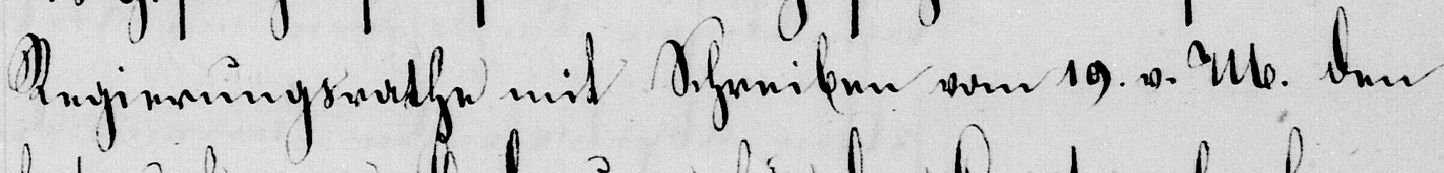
Regierungsrathe mit Schreiben vom 19. v. M. den
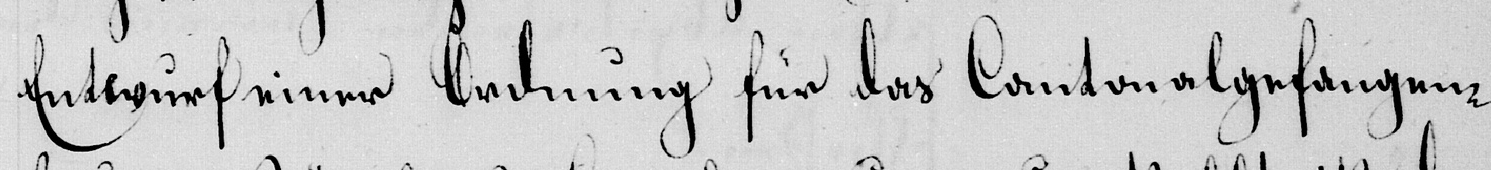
Entwurf einer Ordnung für das Cantonalgefangen¬
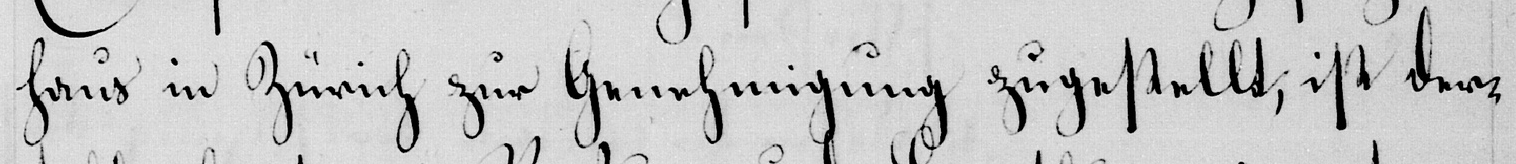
haus in Zürich zur Genehmigung zugestellt, ist der¬
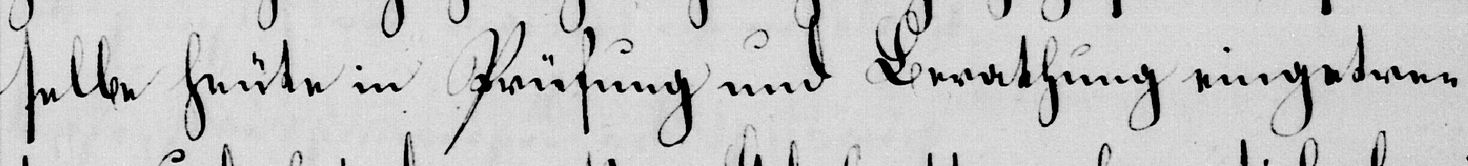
selbe heute in Prüfung und Berathung eingetre¬
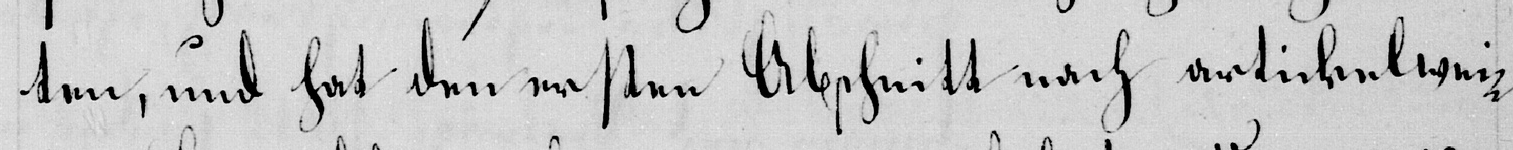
ten, und hat den ersten Abschnitt nach artickelwei¬
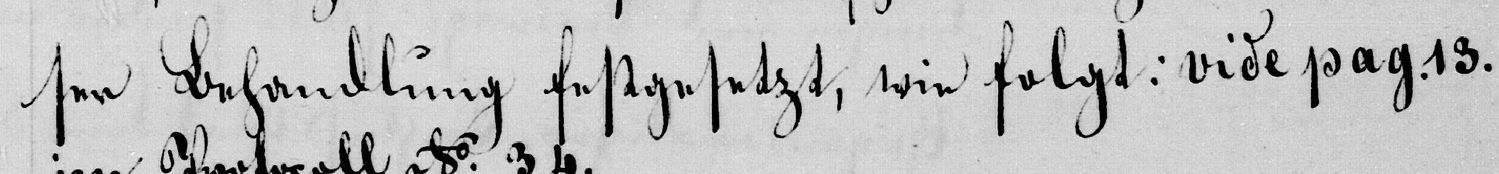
ser Behandlung festgesetzt, wie folgt: vide pag. 13.
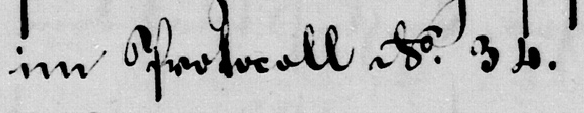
im Protokoll No. 34.
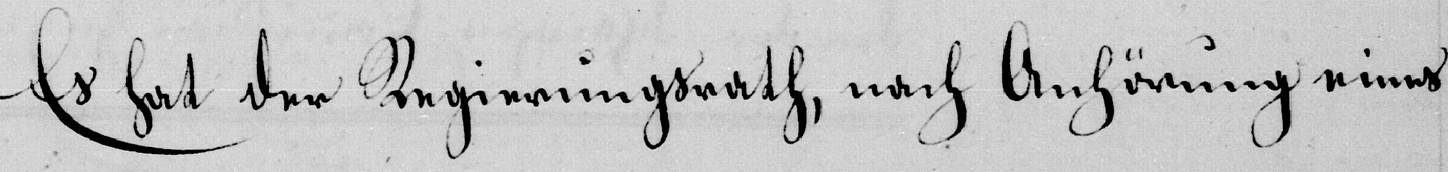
Es hat der Regierungsrath, nach Anhörung eines
